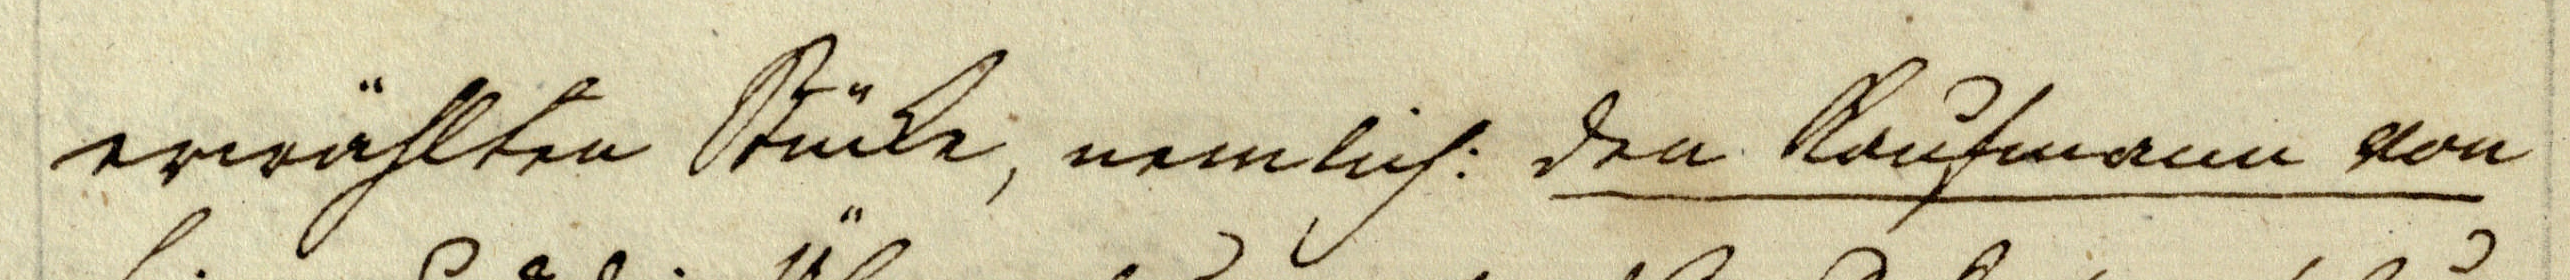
erwählten Stücke, nemlich: den Kaufmann von
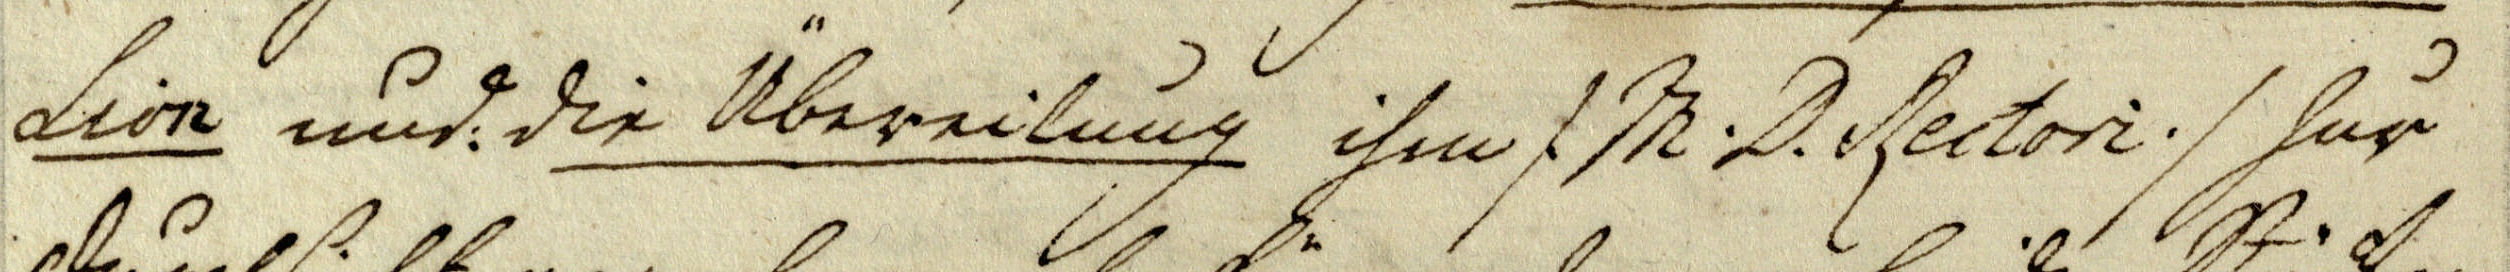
Lion und: die Übereilung ihm / M. D. Rectori ./ zur
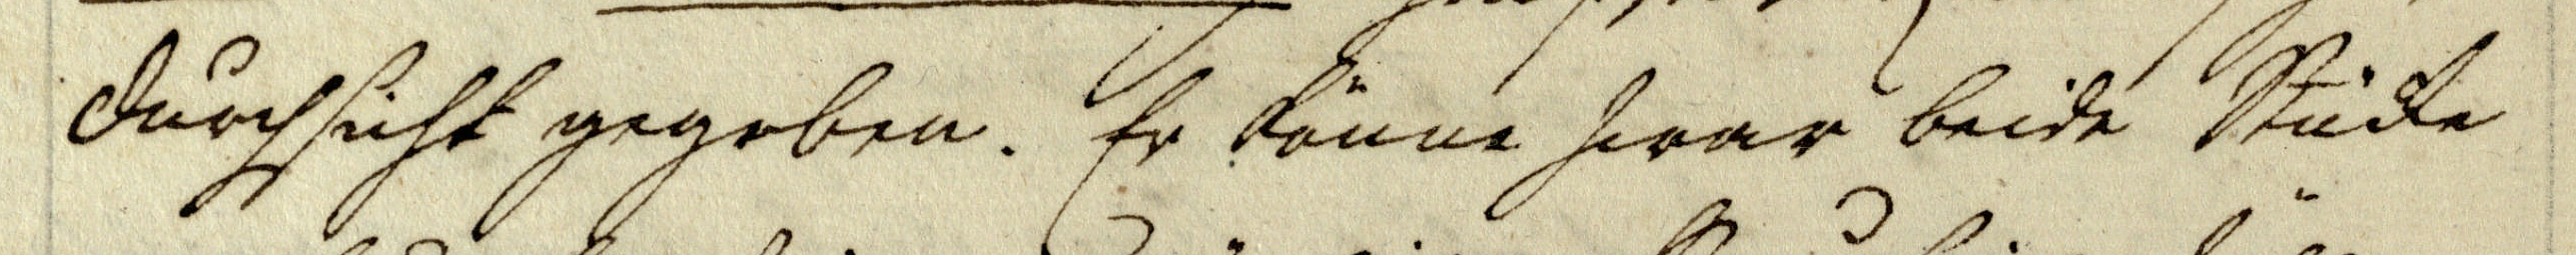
Durchsicht gegeben. Er könne zwar beide Stücke
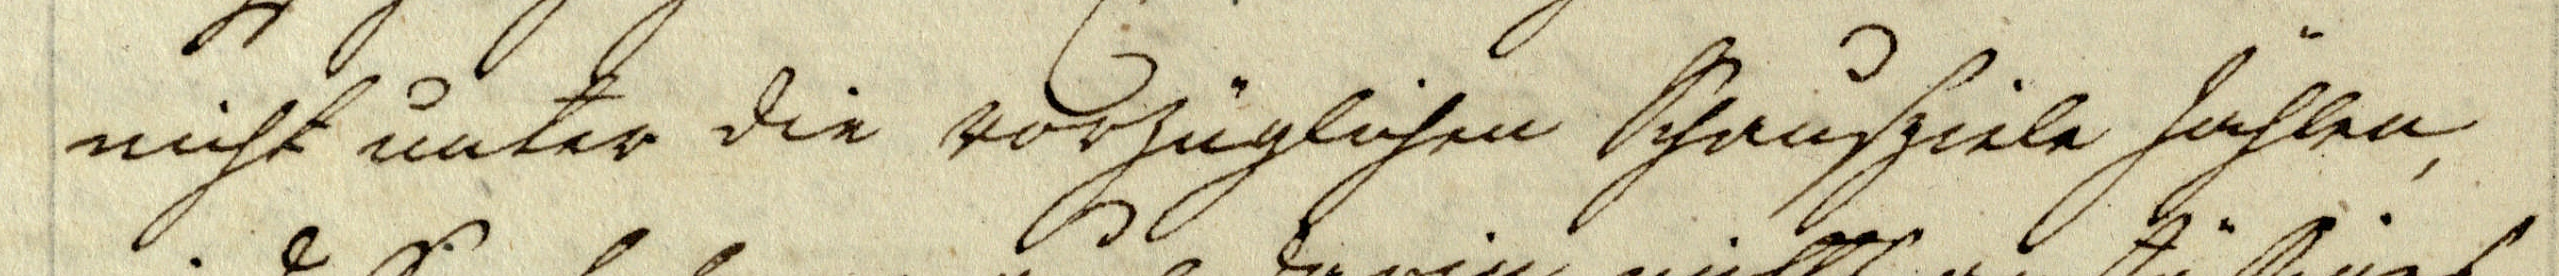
nicht unter die vorzüglichen Schauspiele zählen,
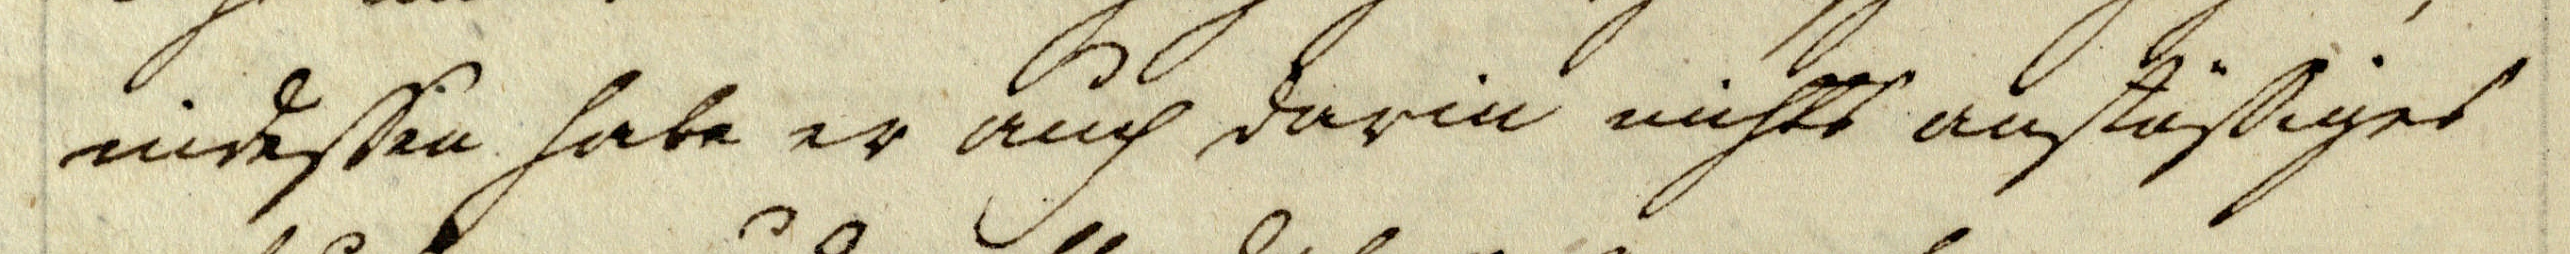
indessen habe er auch darin nichts anstössiges
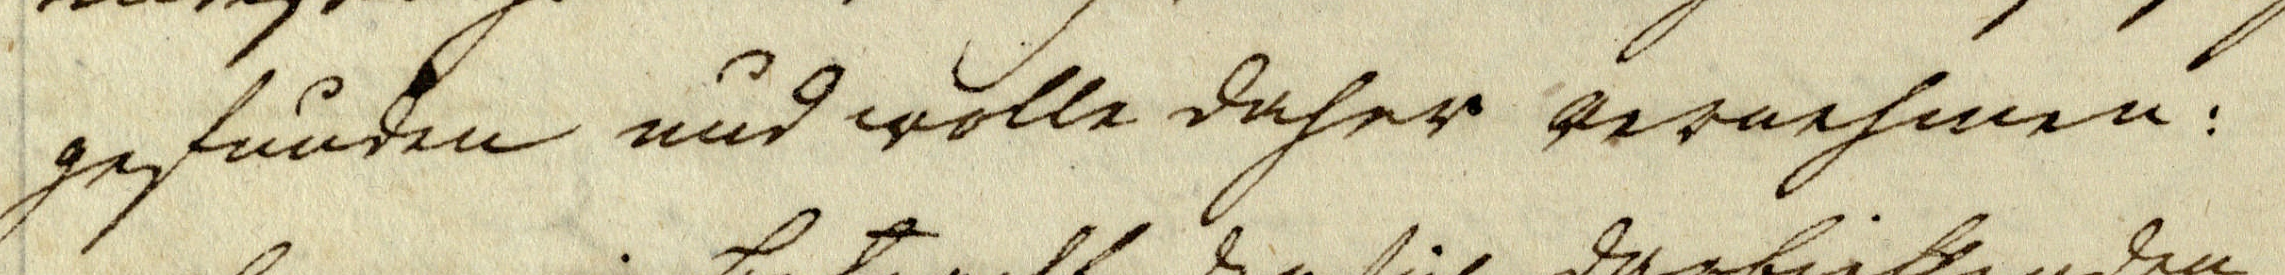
gefunden und wolle daher vernehmen:
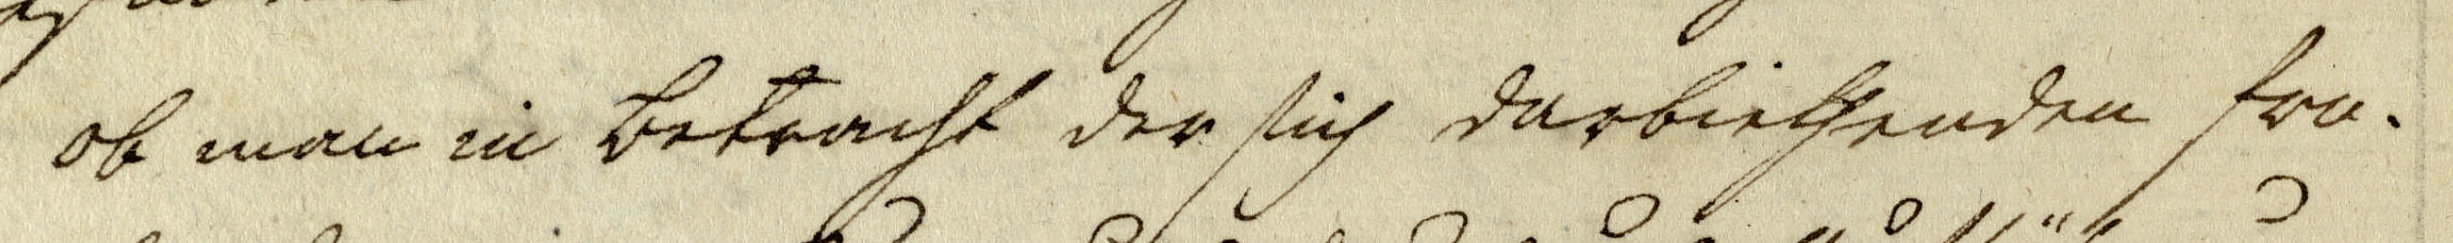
ob man in Betracht der sich darbiethenden fro¬
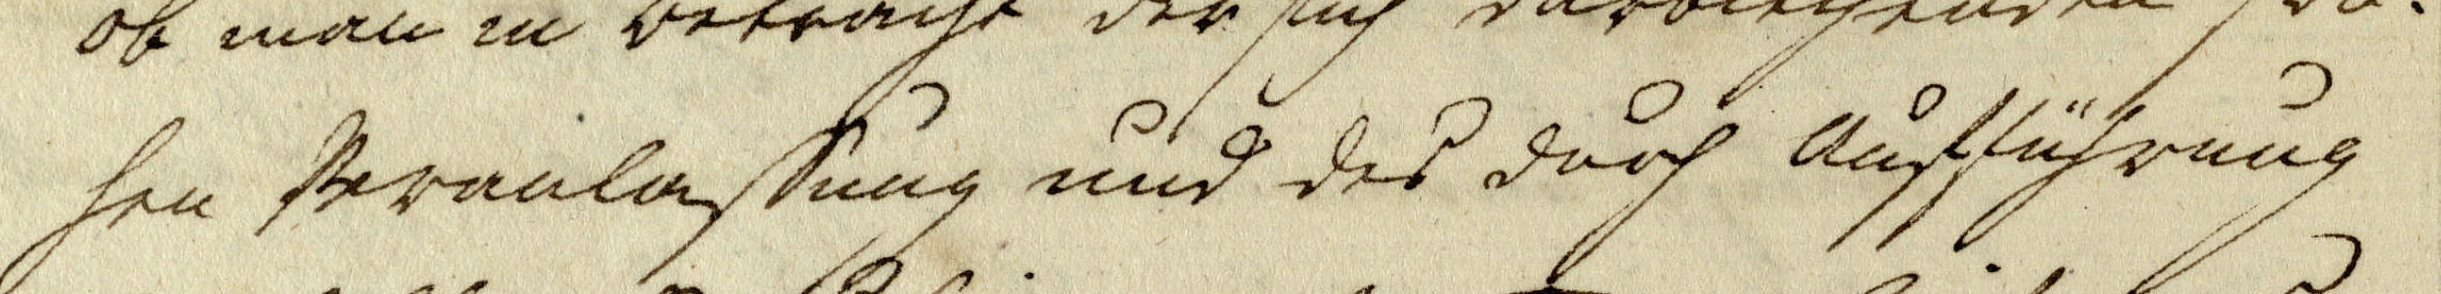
hen Veranlassung und des durch Aufführung
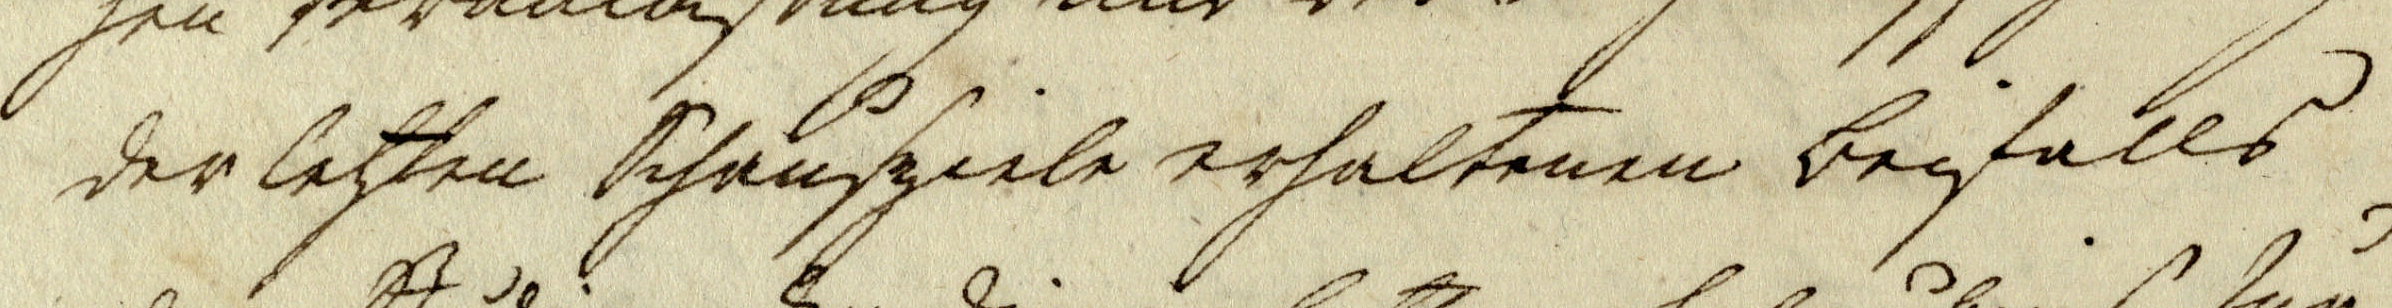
der letzten Schauspiele erhaltenen Beifalls
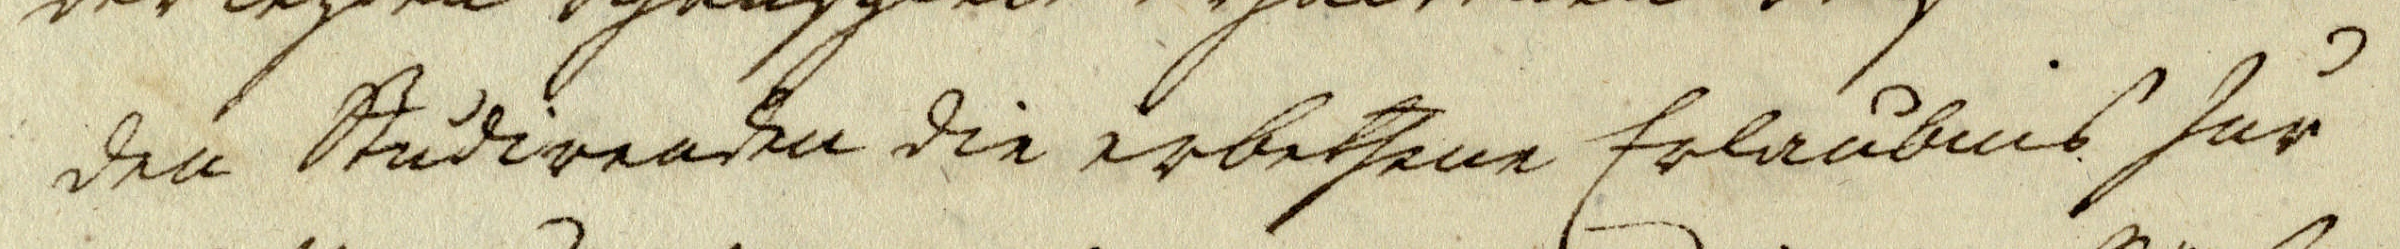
den Studirenden die erbethene Erlaubnis zur
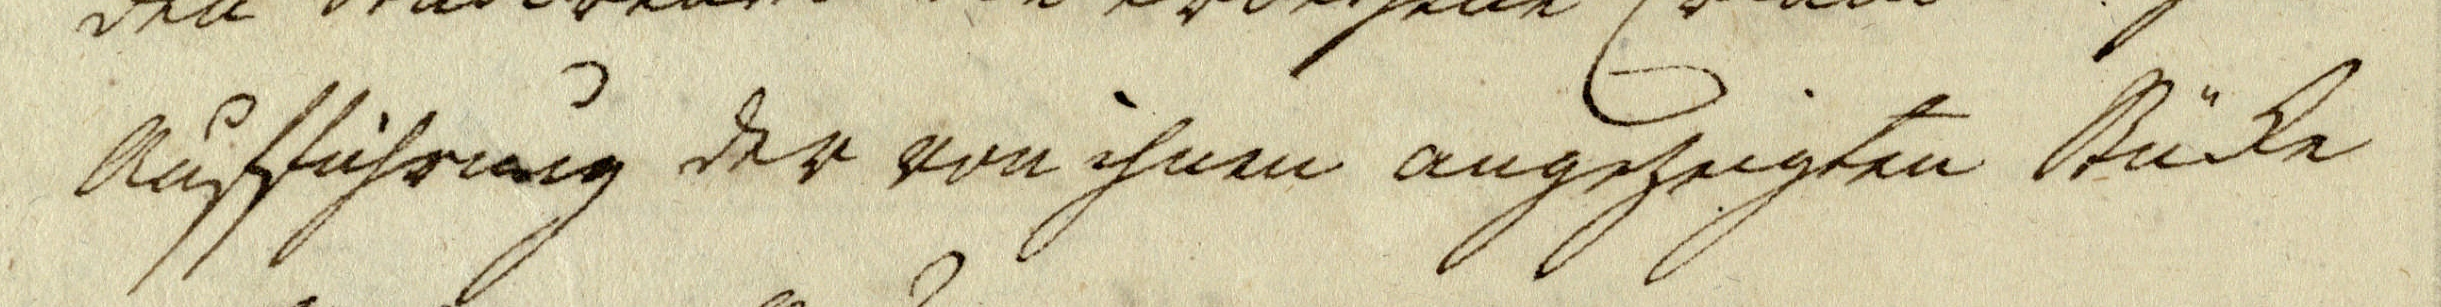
Aufführung der von ihnen angezeigten Stücke
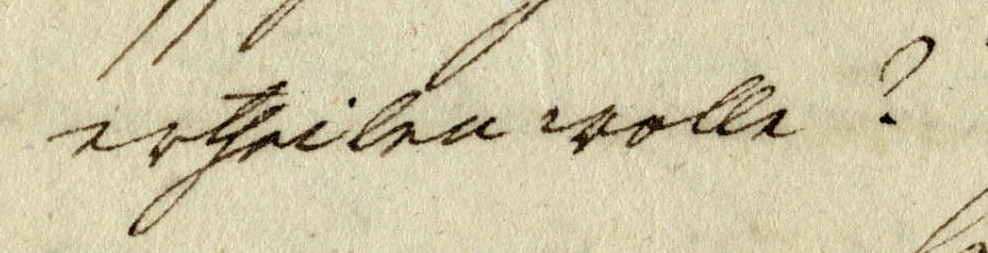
ertheilen wolle?
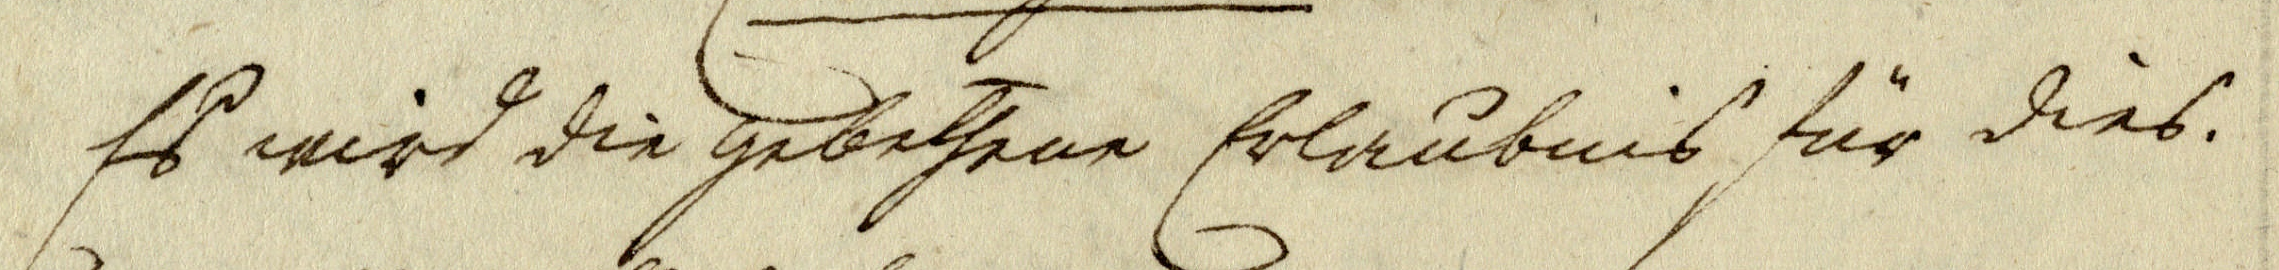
Es wird die gebethene Erlaubnis für dies¬
